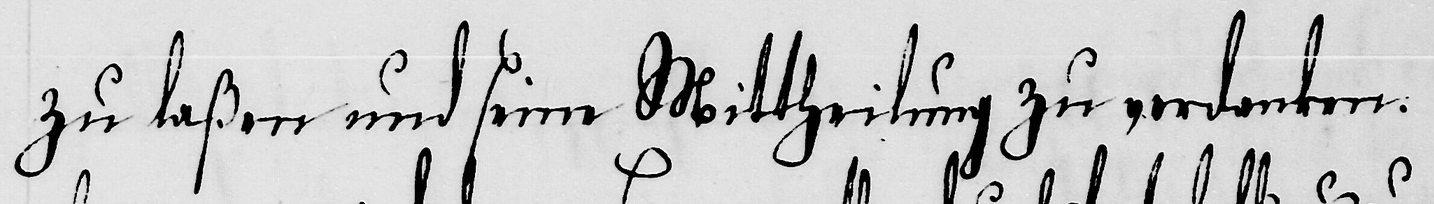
zu laßen und seine Mittheilung zu verdanken.
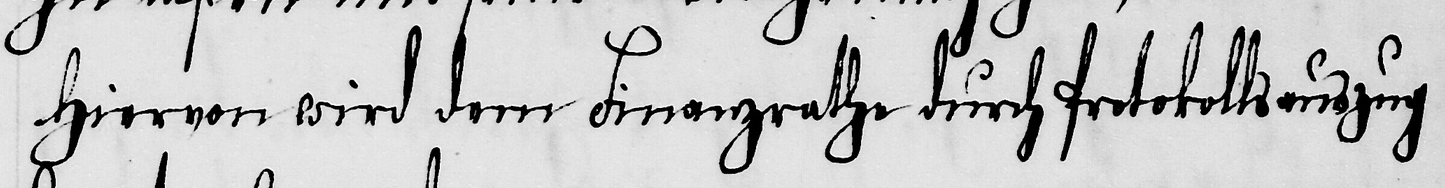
Hiervon wird dem Finanzrathe durch Protokollsauszug
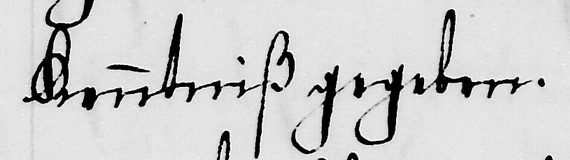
Kenntniß gegeben.
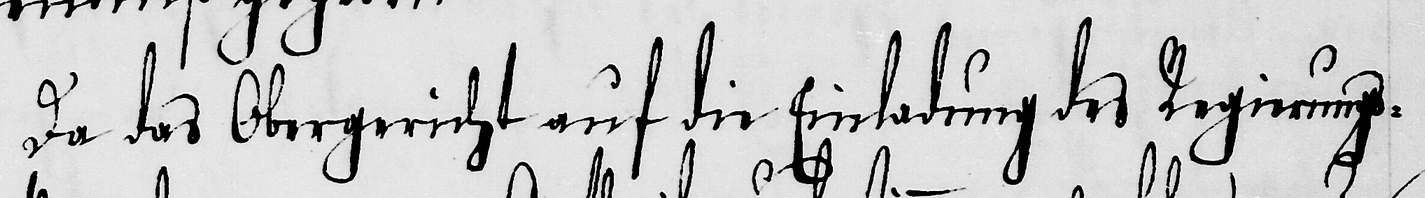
Da das Obergericht auf die Einladung des Regierungs¬
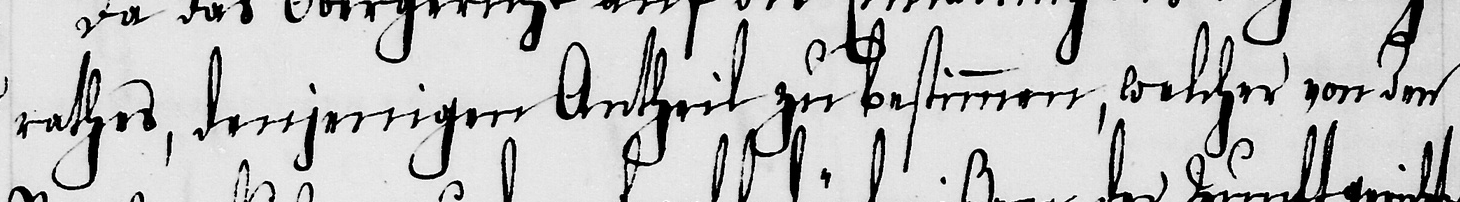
rathes, denjenigen Antheil zu bestimmen, welcher von den
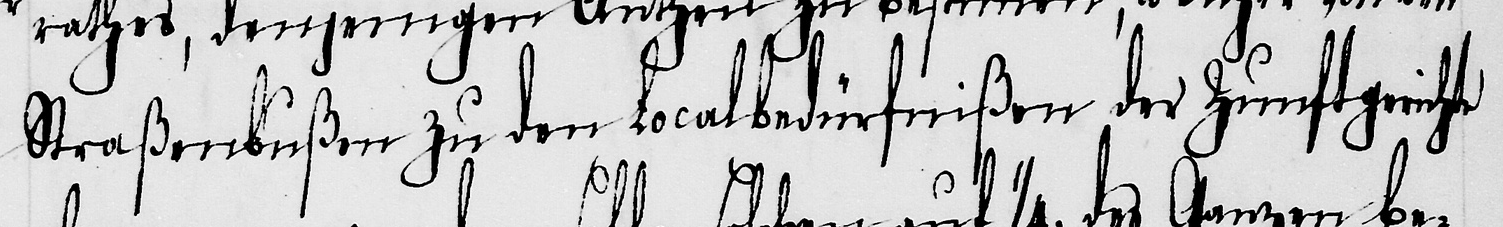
Straßenbußen zu den Localbedürfnißen der Zunftgerichte
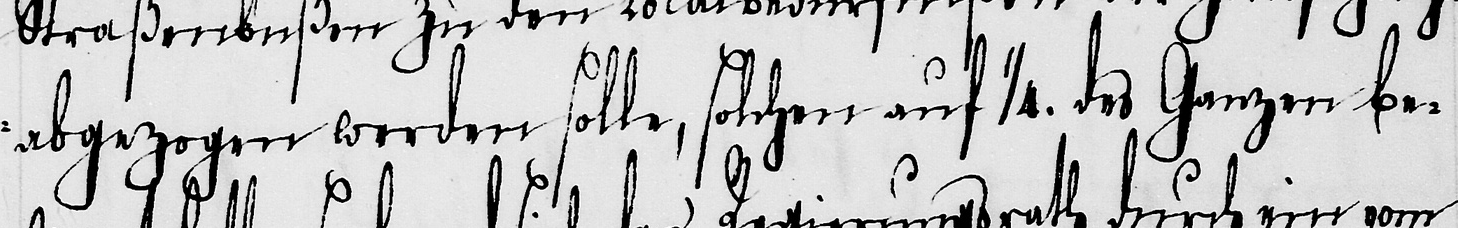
abgezogen werden solle, solchen auf ¼. des Ganzen be¬
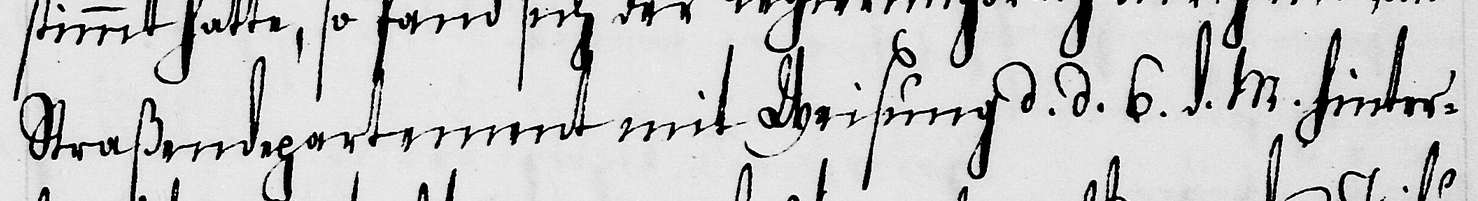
Straßendepartement mit Weisung d.d. 6. d. M. hinter¬
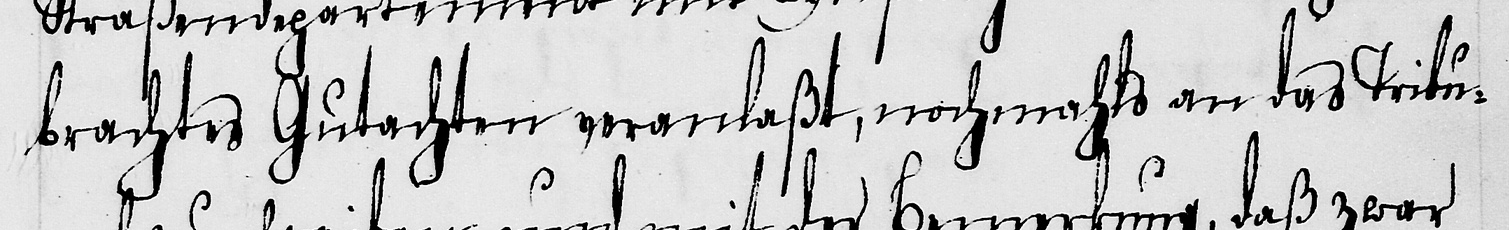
brachtes Gutachten veranlaßt, nochmahls an das Tribu¬
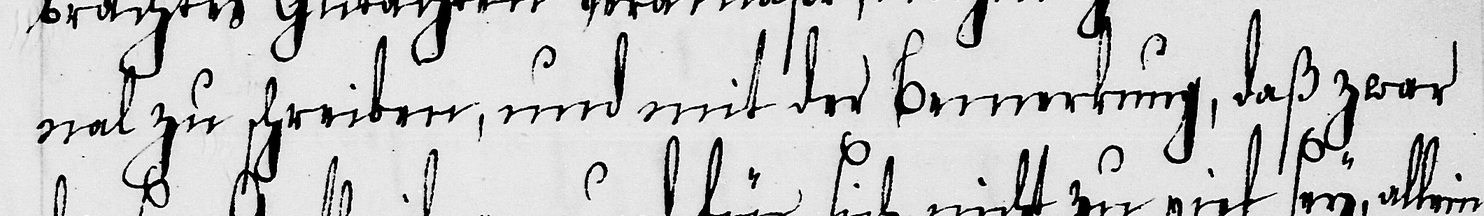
nal zu schreiben, und mit der Bemerkung, daß zwar
